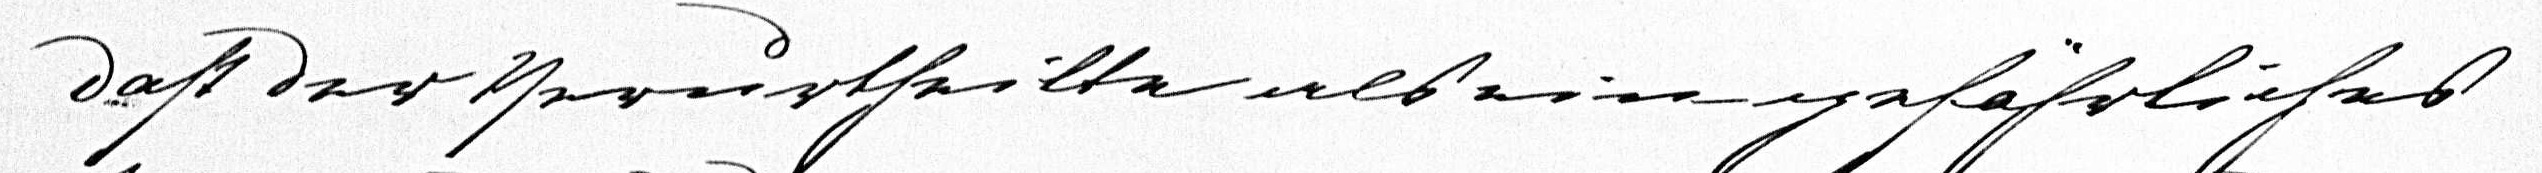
daß der Verurtheilte als ein gefährliches
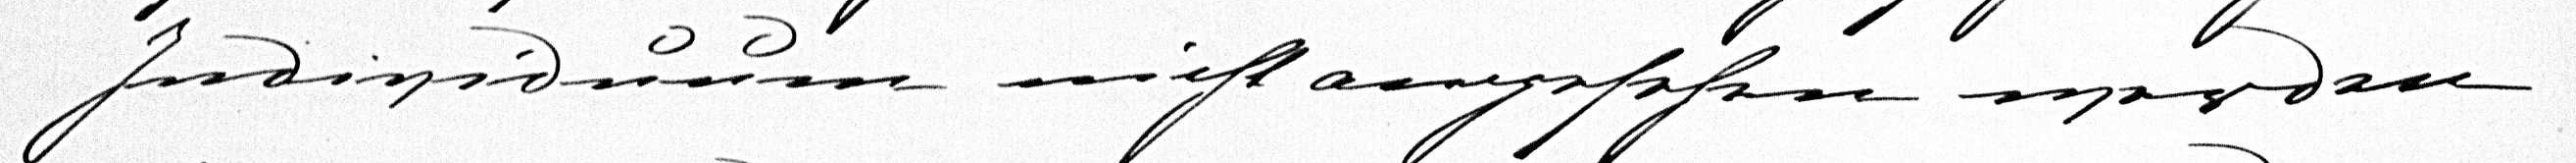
Jndividuum nicht angesehen werden
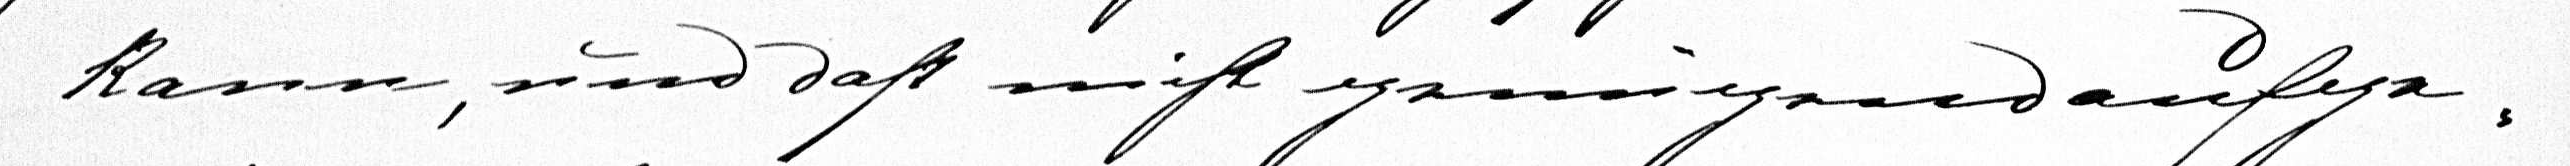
kann, und daß nicht genügend aufge¬
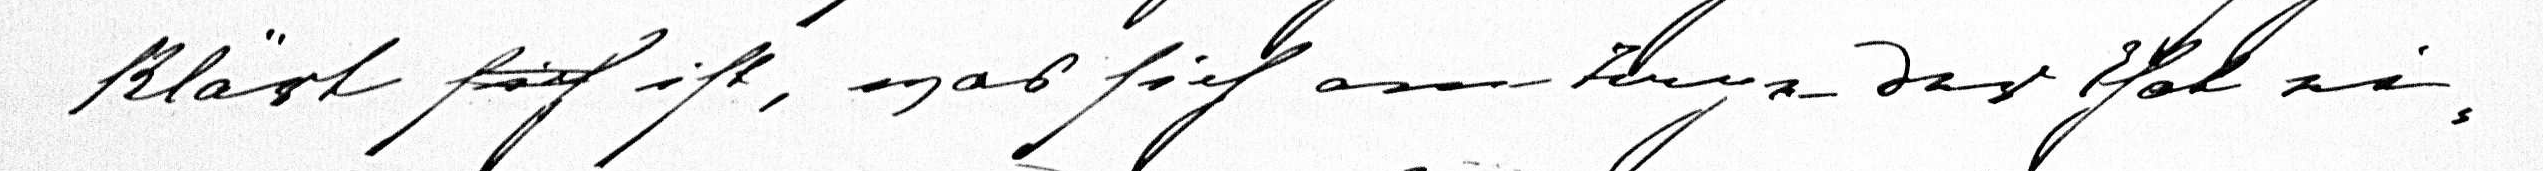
klärt ist, was sich am Tage der That ei¬
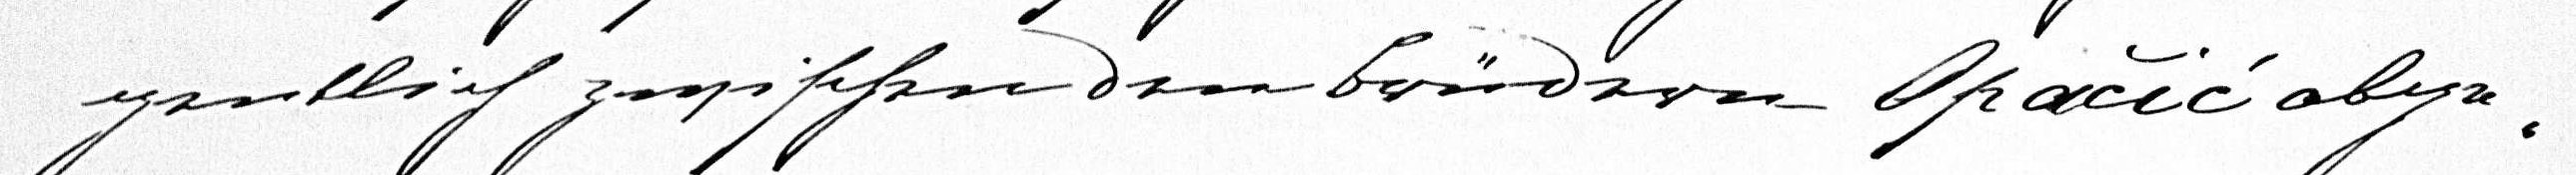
gentlich zwischen den Brüdern Opačić abge¬
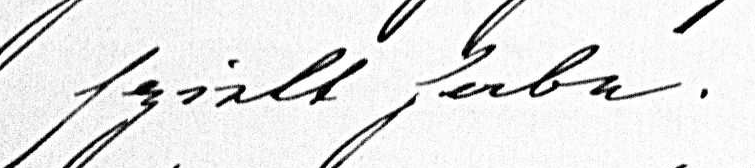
spielt habe.
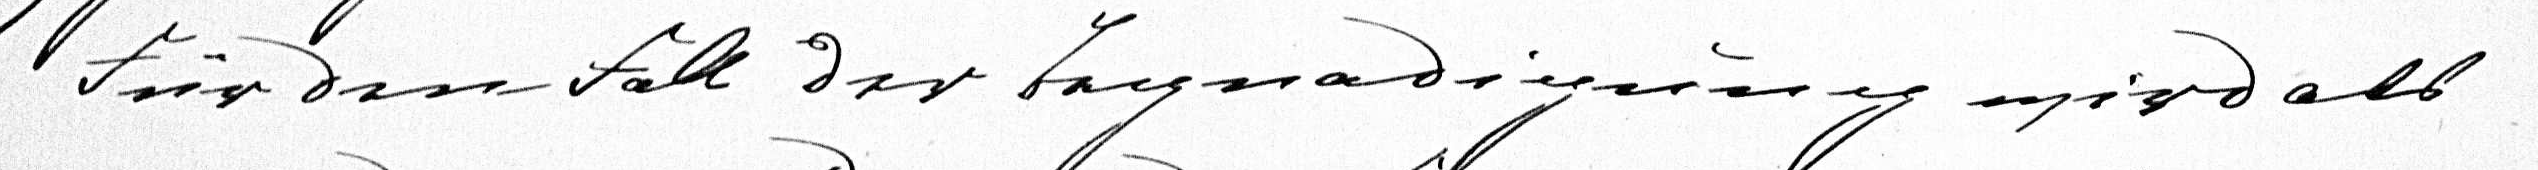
Für den Fall der Begnadigung wird als
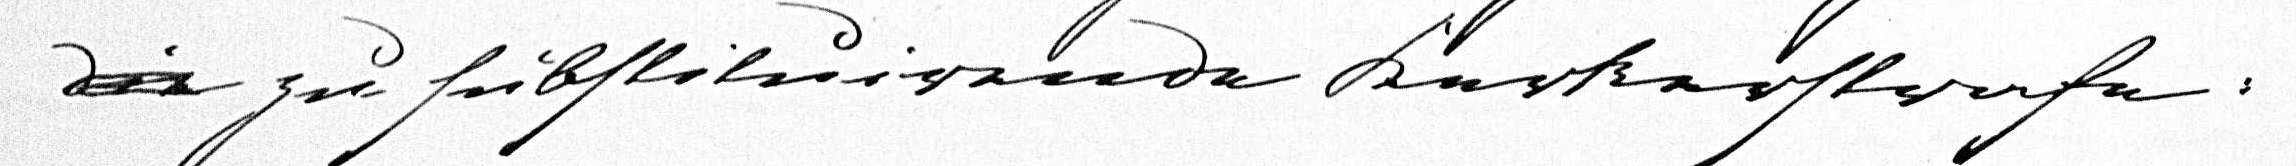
zu substituirende Kerkerstrafe:
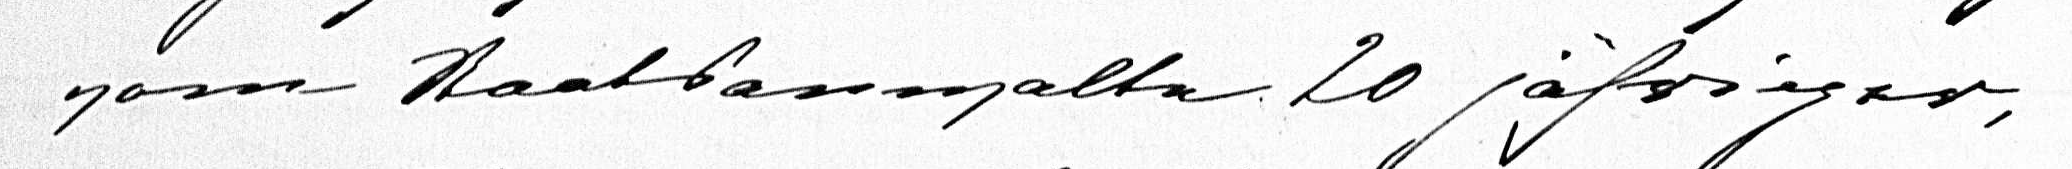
vom Staatsanwalte 20 jähriger,
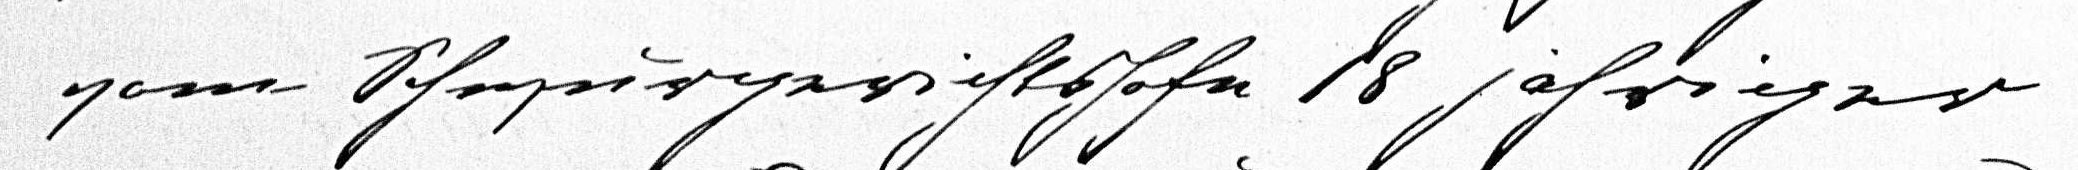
vom Schwurgerichtshofe 18 jahriger
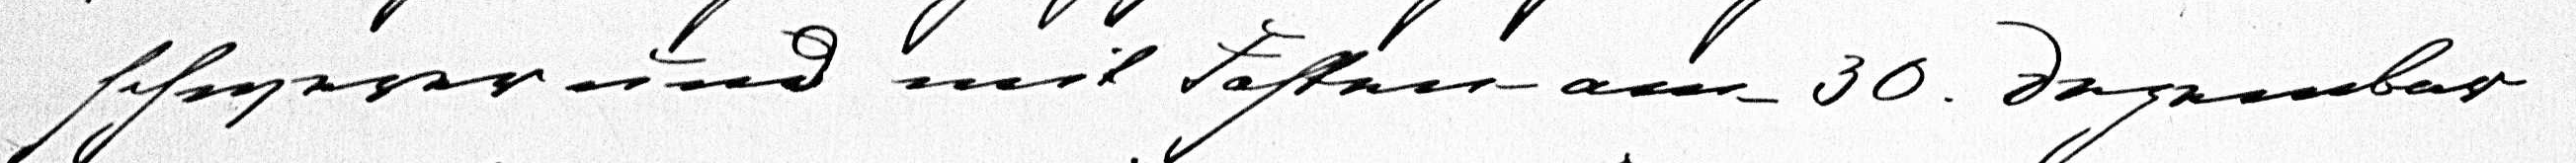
schwerer und mit Fasten am 30. Dezember
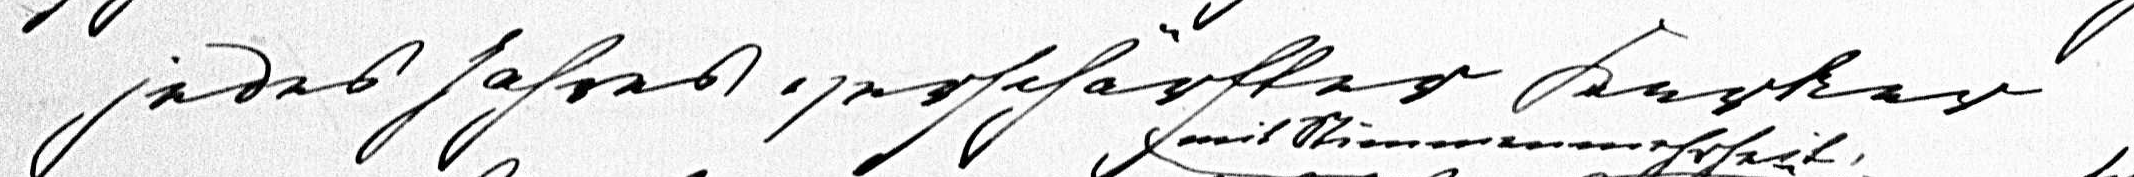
jedes Jahres verschärfter Kerker
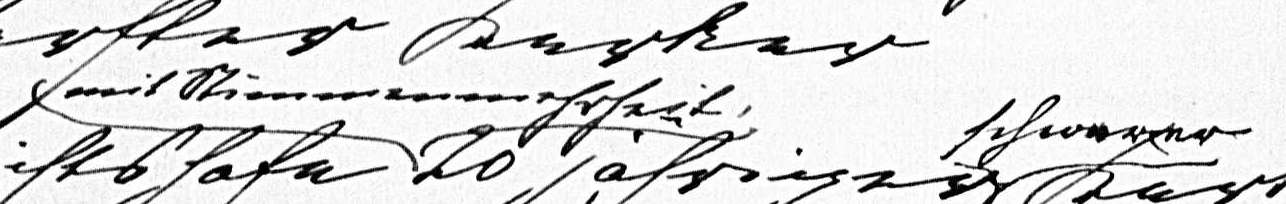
mit Stimmenmehrheit, schweger
